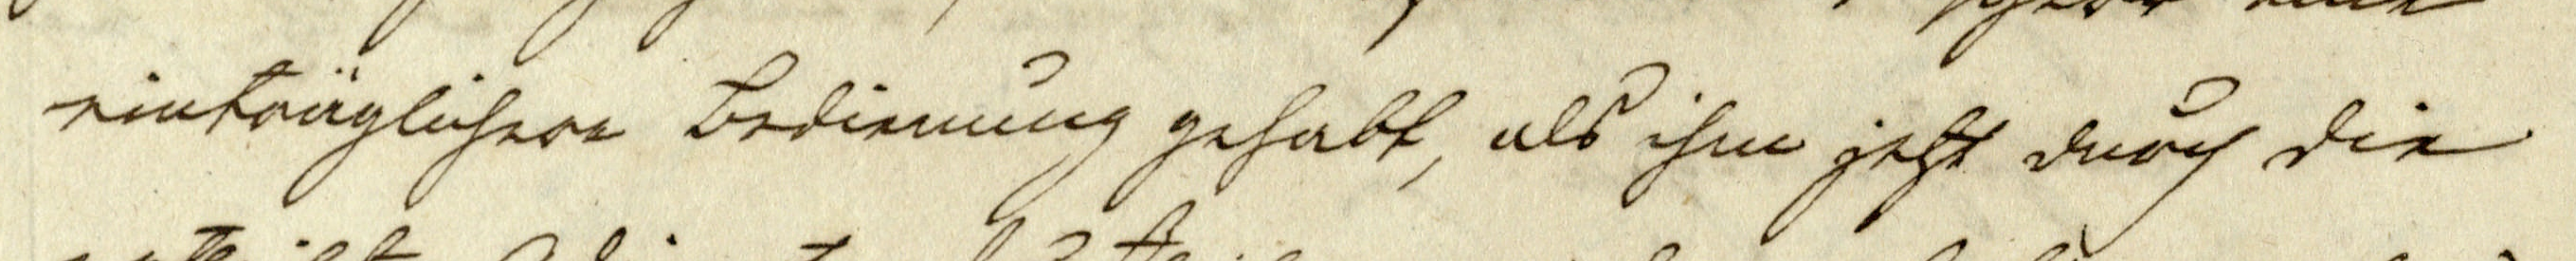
einträglichere Bedienung gehabt, als ihm jetzt durch die
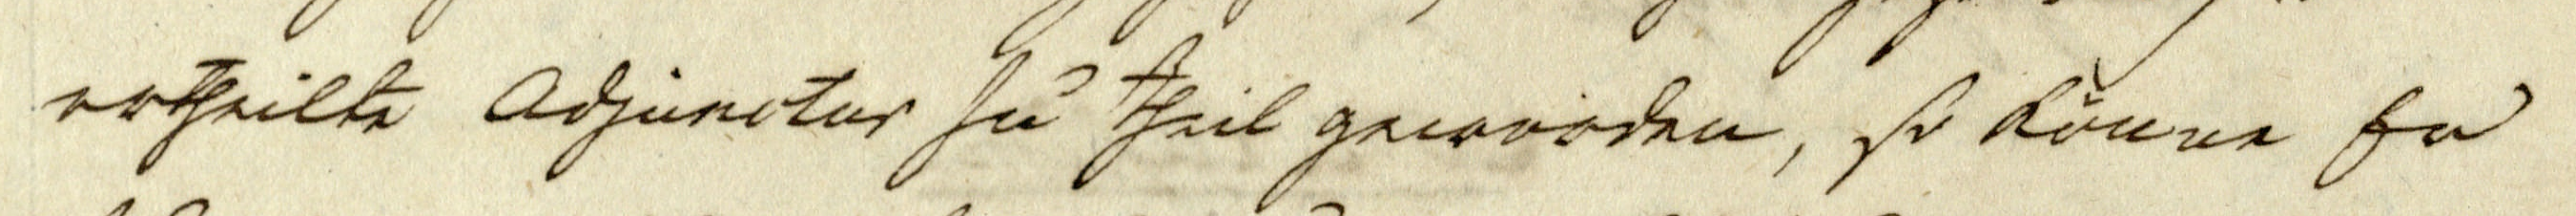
ertheilte Adjunctur zu zu Theil geworden, so könne Er
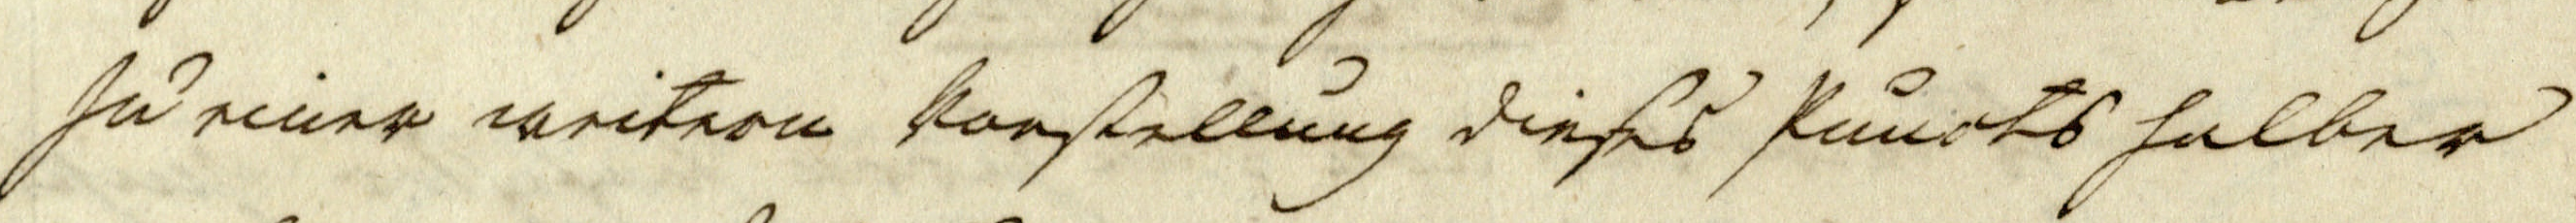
zu einer weiteren Vorstellung dieses Puncts halber
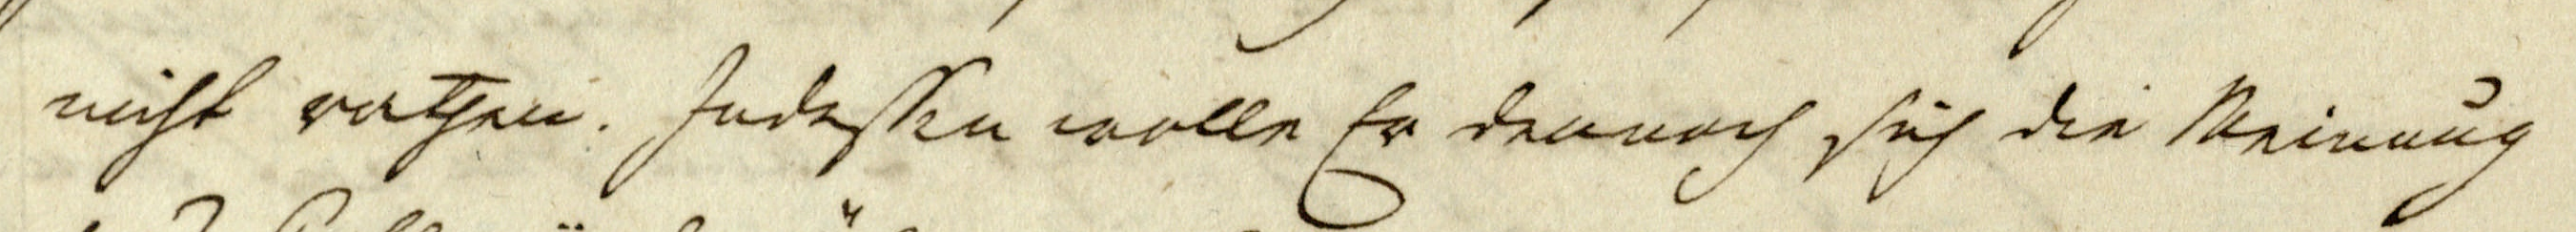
nicht rathen. Indessen wolle Er dennoch sich die Meinung
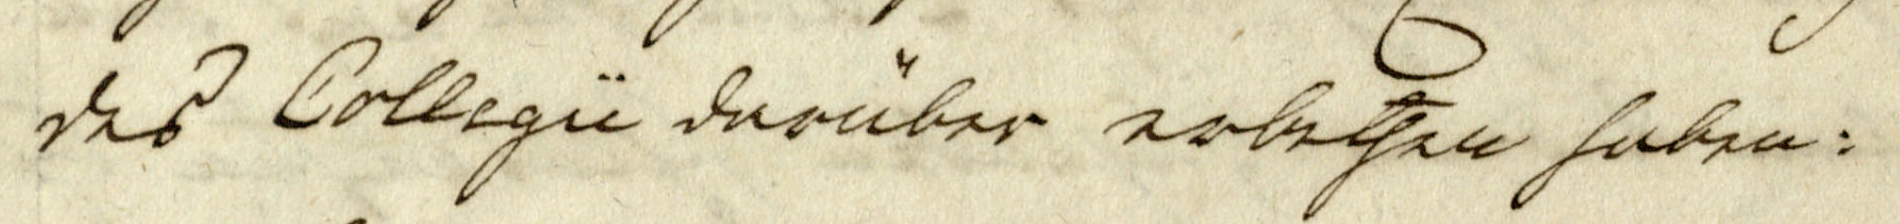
des Collegii darüber erbethen haben:
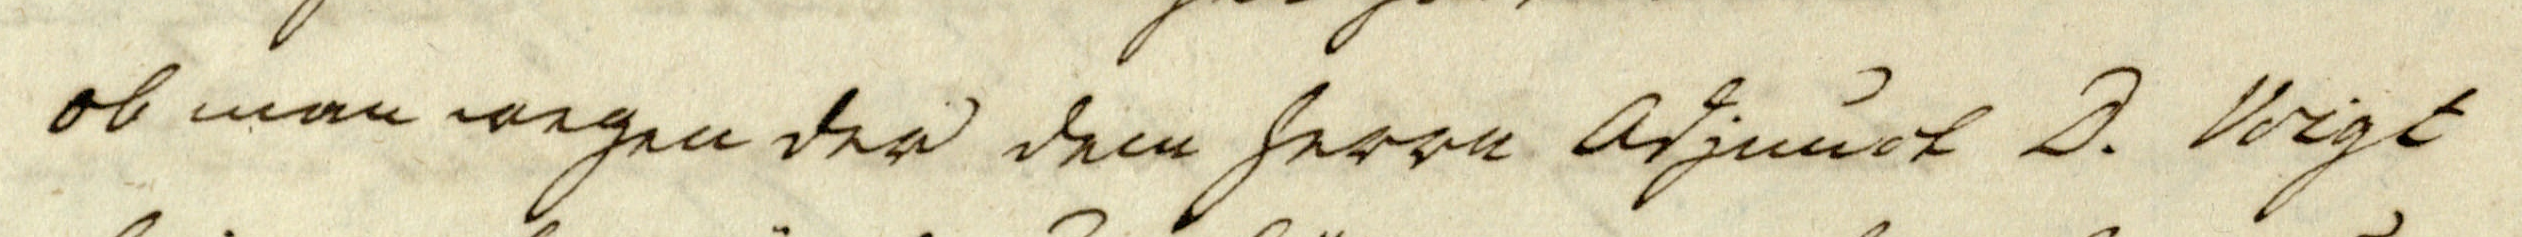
ob man wegen der dem herrn Adjunct D. Voigt
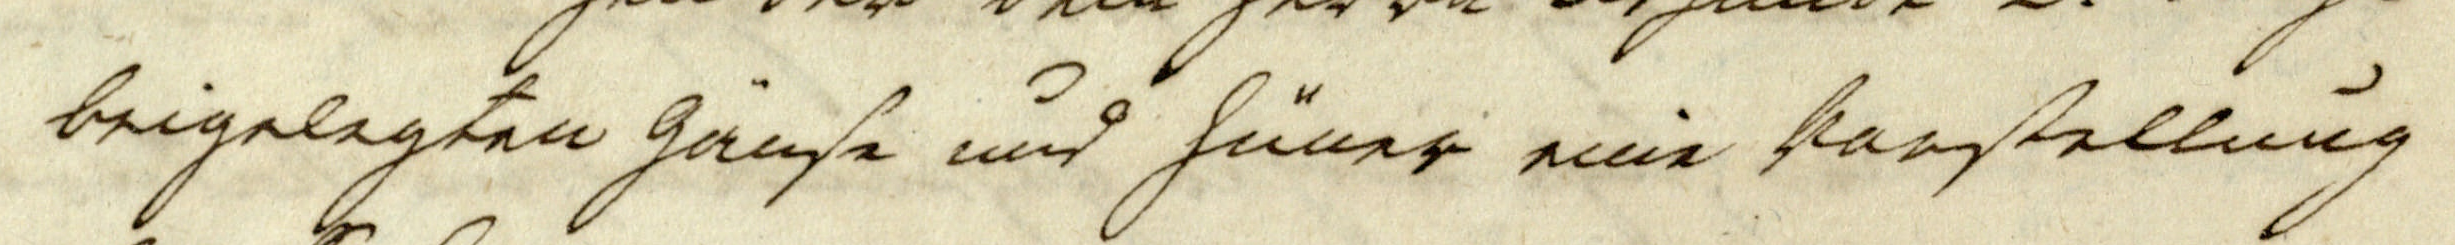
beigelegten Gänse und Hüner eine Vorstellung
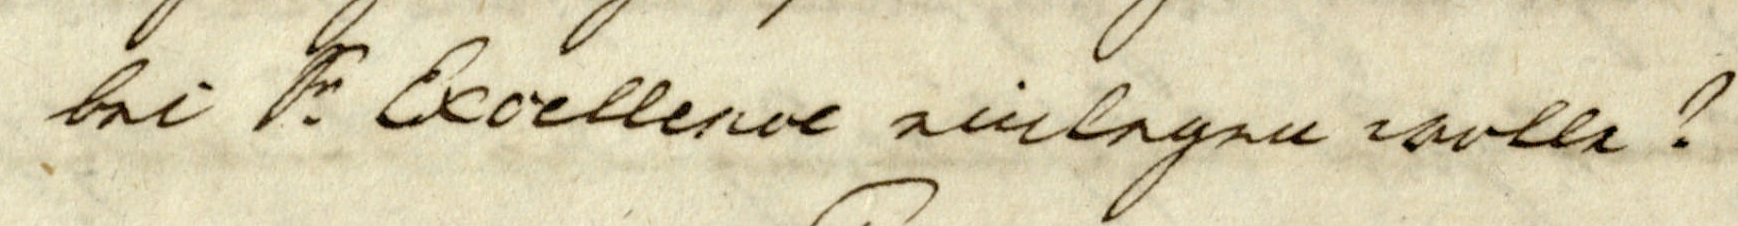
bei Sr. Excellence einlegen wolle!
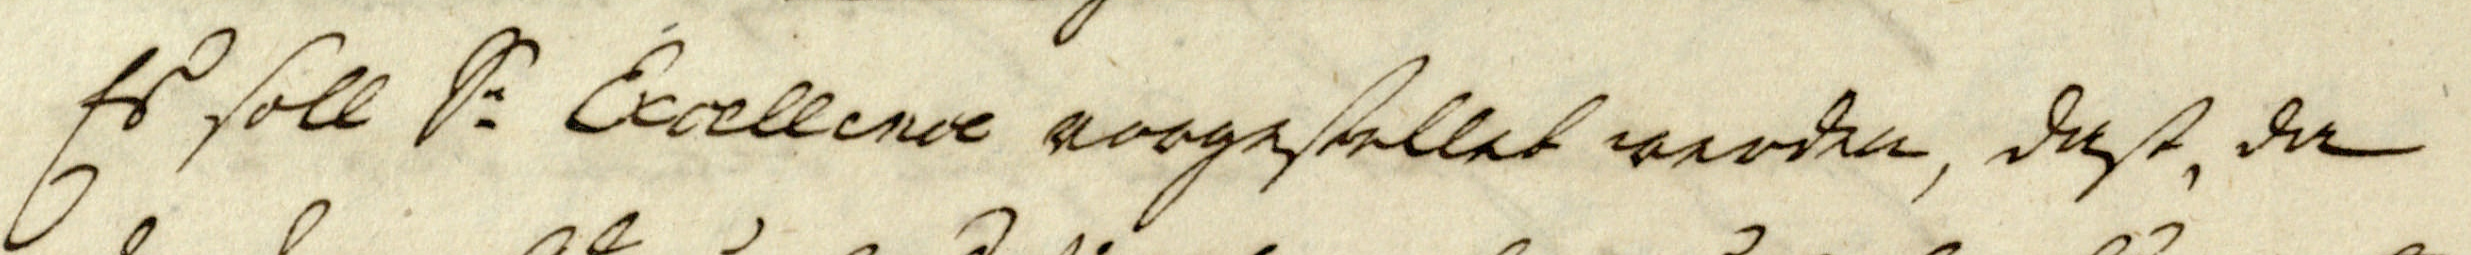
Es soll Sr. Excellence vorgestellet werden, daß, da
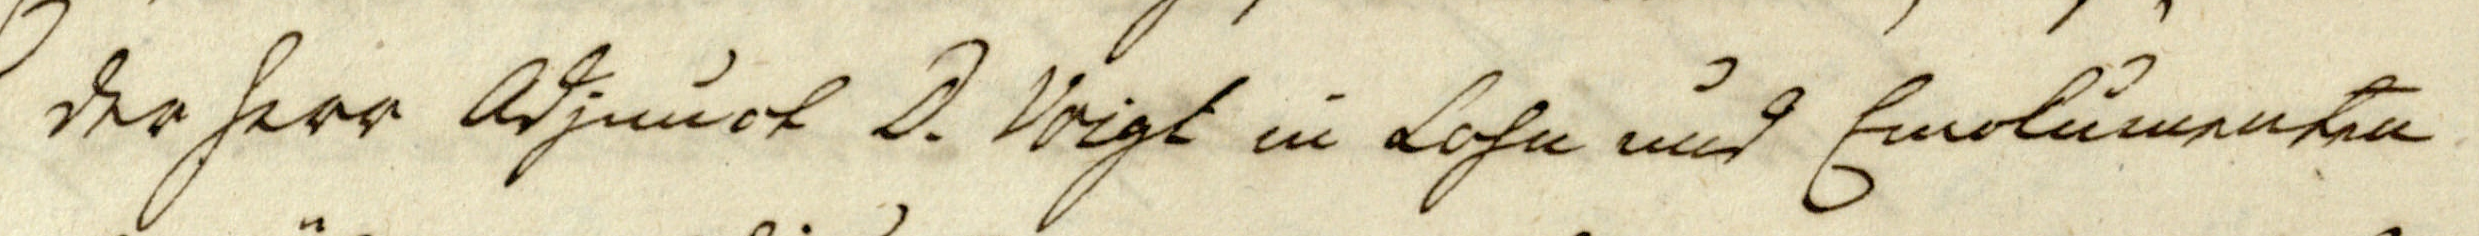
der herr Adjunct D. Voigt in Lohn und Emolumenten
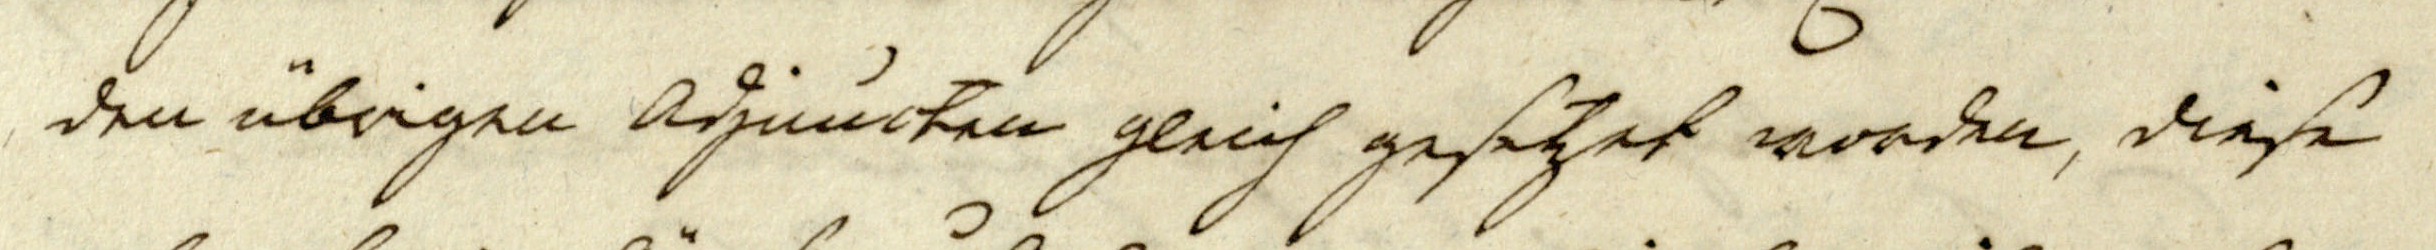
den übrigen Adjuncten gleich gesetzet worden, diese
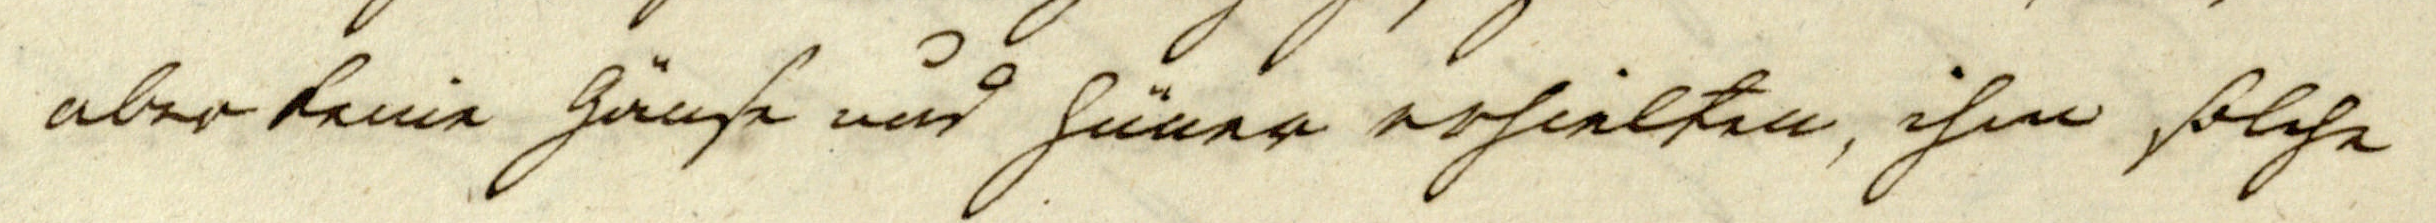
aber keine Gänse und Hüner erhielten, ihm solche
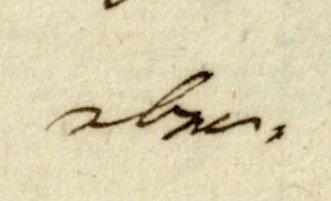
eben.
